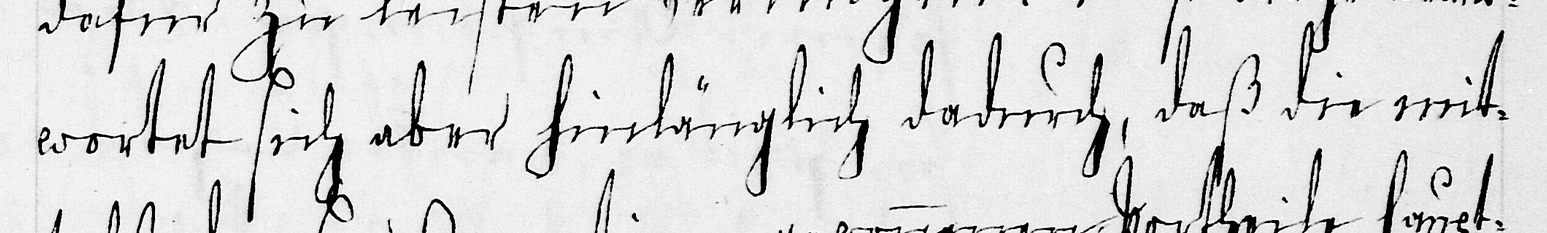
wortet sich aber hinlänglich dadurch, daß die mit¬
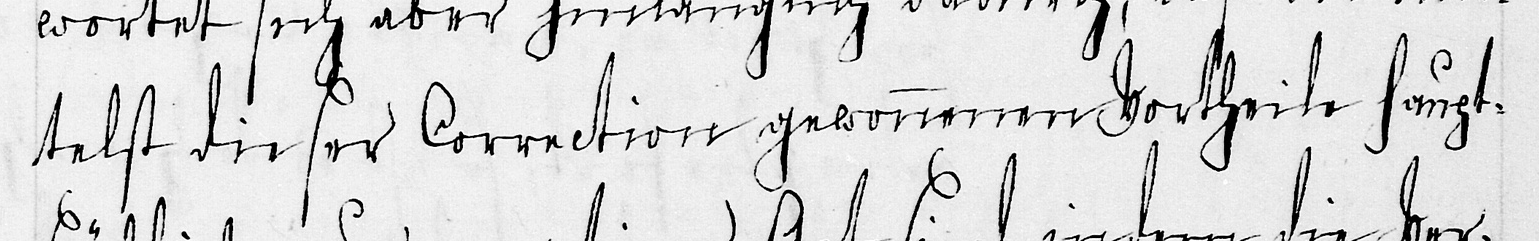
telst dieser Correction gewonnenen Vortheile haupt¬
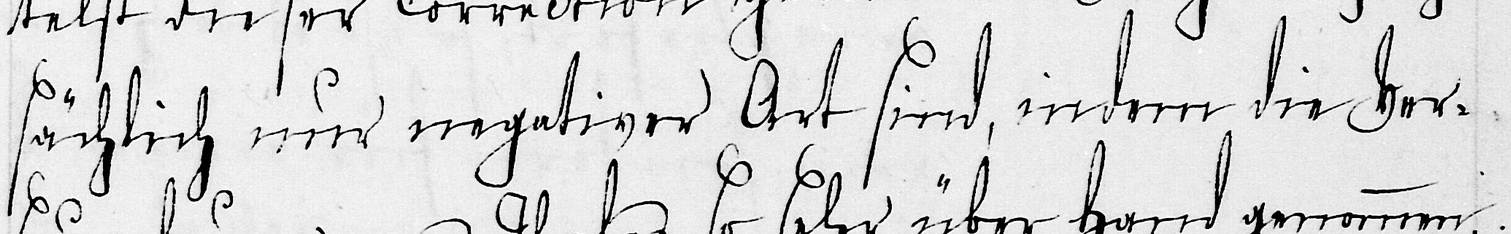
sächlich nur negativer Art sind, indem die Ver¬
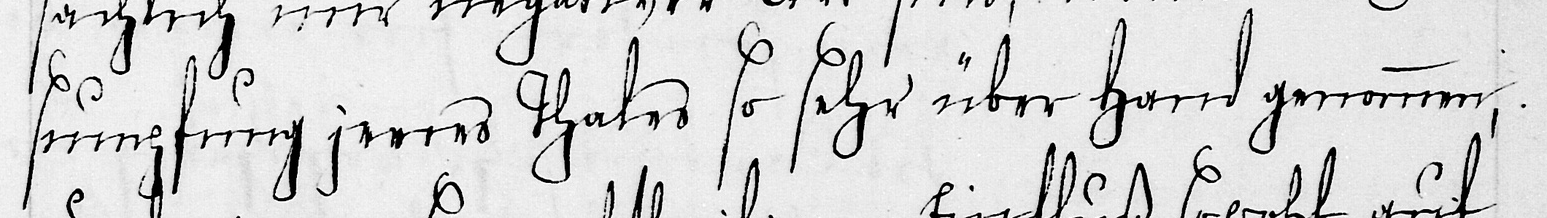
sumpfung jenes Thales so sehr über Hand genommen,
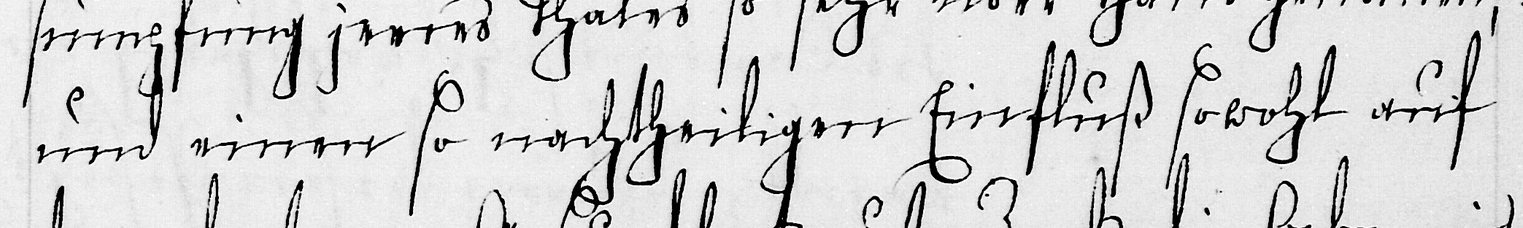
und einen so nachtheiligen Einfluß sowohl auf
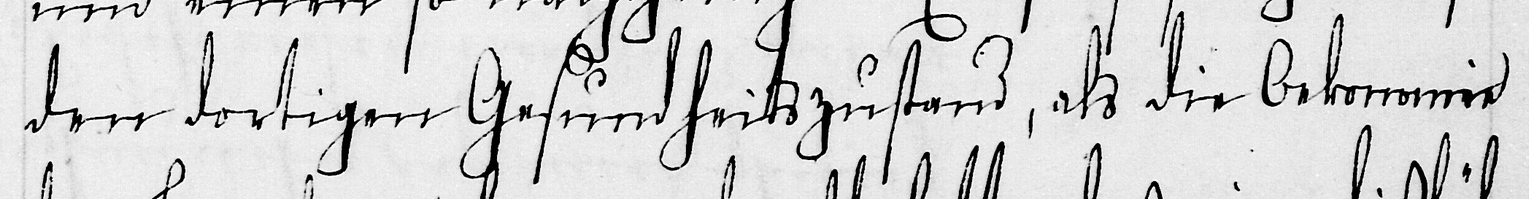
den dortigen Gesundheitszustand, als die Oekonomie
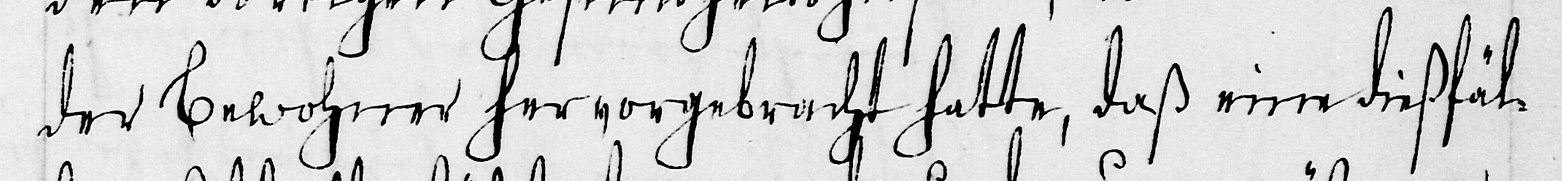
der Bewohner hervorgebracht hatte, daß eine dießfäl¬
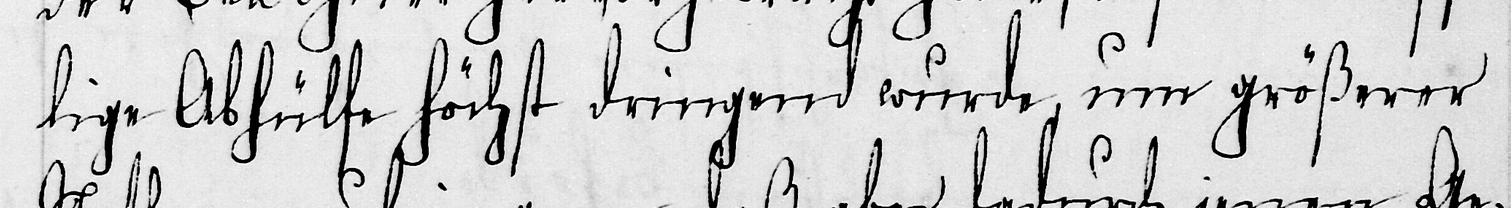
lige Abhülfe höchst dringend wurde, um größerer
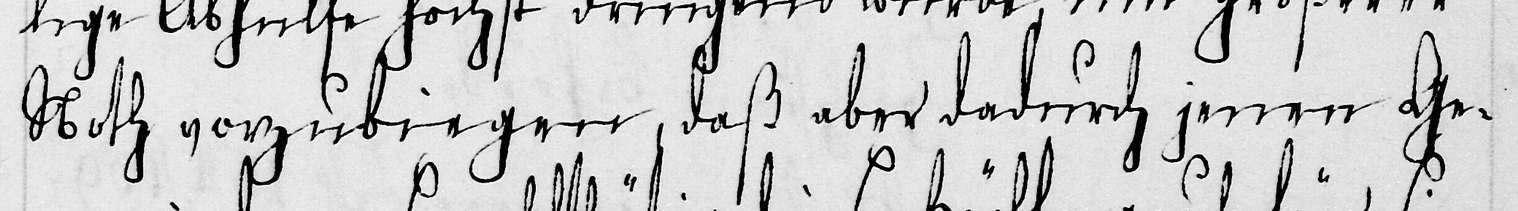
Noth vorzubiegen, daß aber dadurch jenen Ge¬
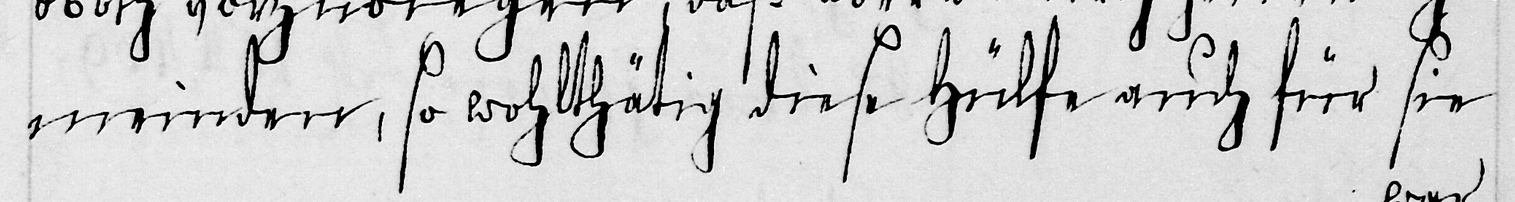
meinden, so wohlthätig diese Hülfe auch für sie
